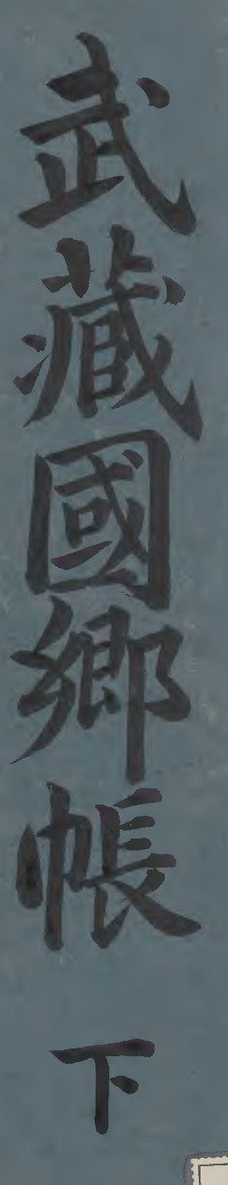武蔵国郷帳下

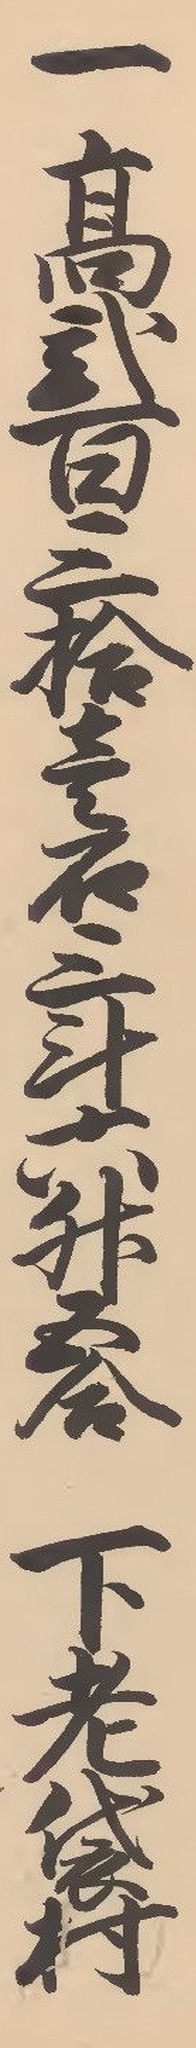一高弐百三拾壱石三斗六升五合下老袋村

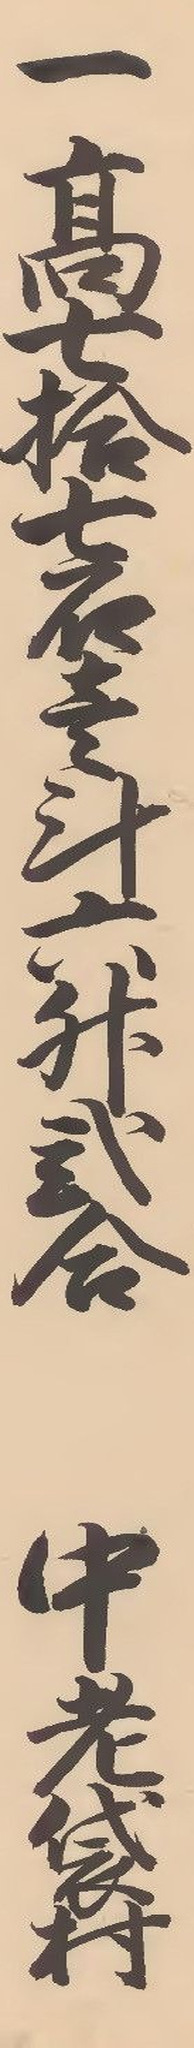一高七拾七石壱斗六升弐合中老袋村
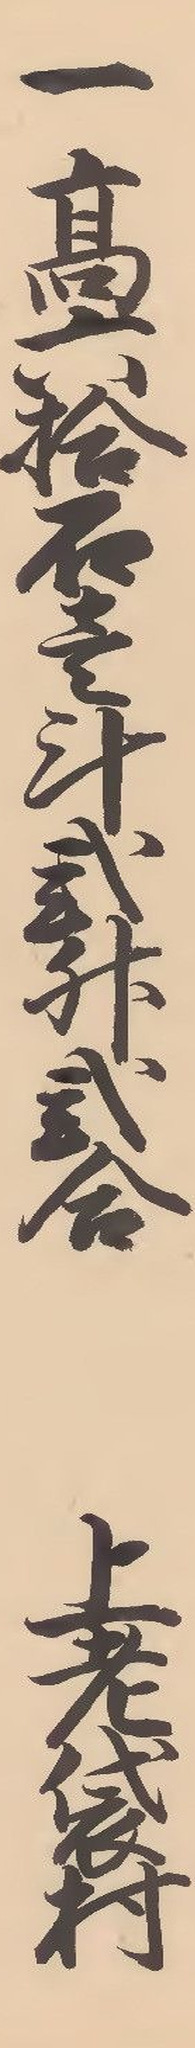一高六拾石壱斗弐升弐合上老袋村
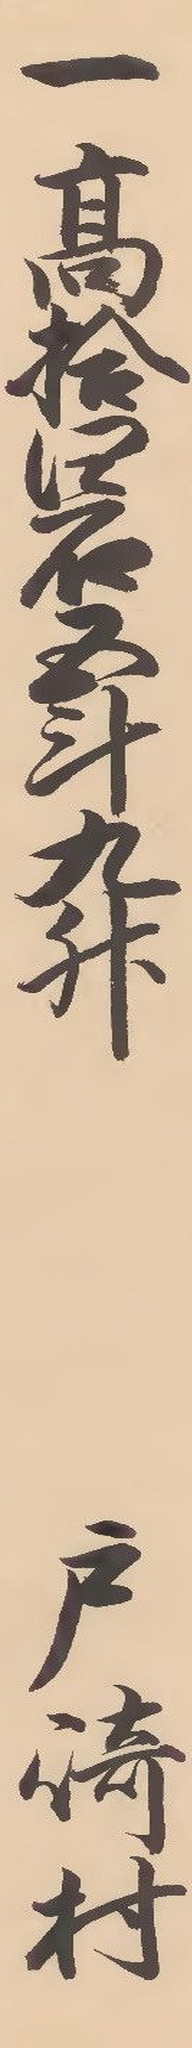一高拾四石五斗九升戸崎村
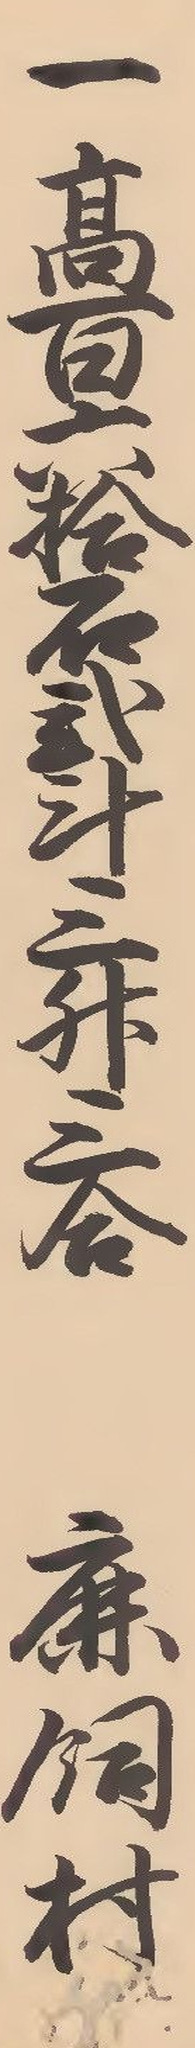一高百六拾石弐斗三升三合鹿飼村
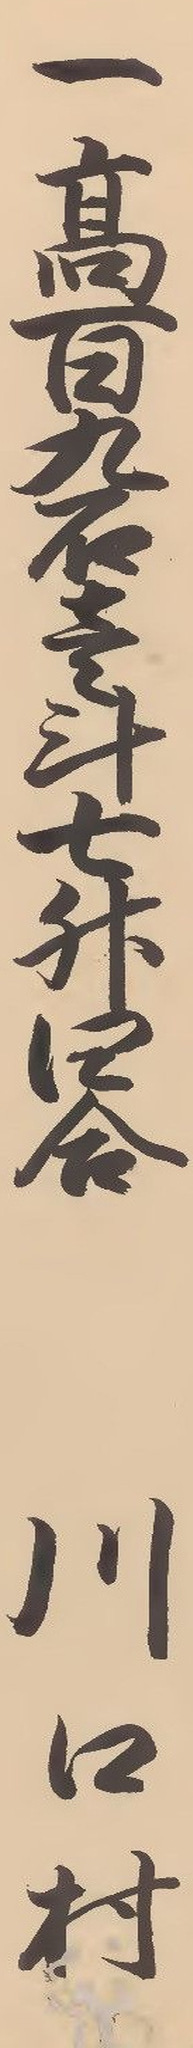一高百九石壱斗七升四合川口村
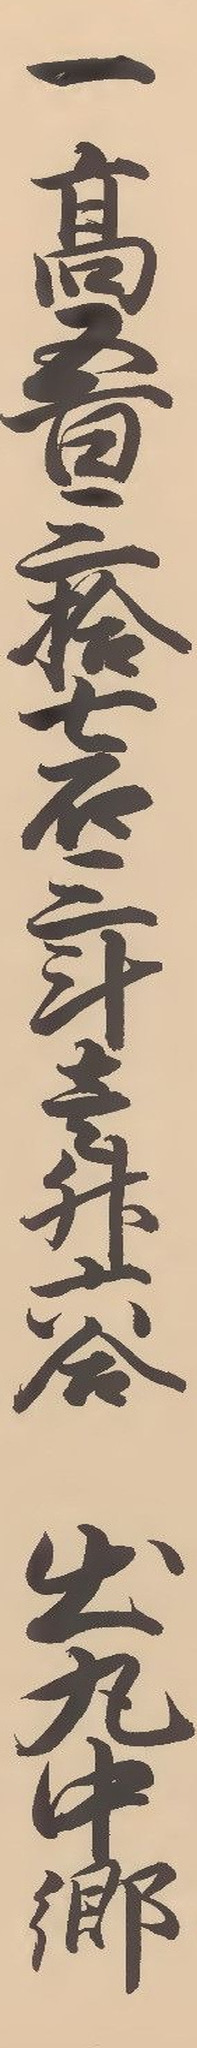一高五百三拾七石三斗壱升六合出丸中郷
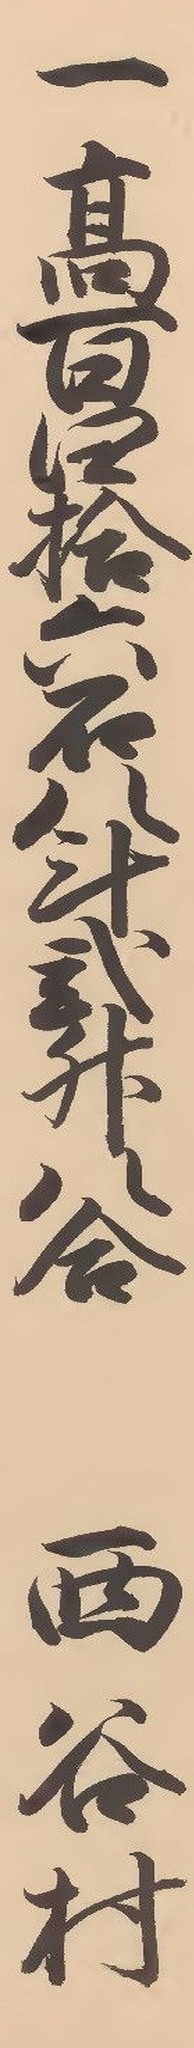一高百四拾六石八斗弐升八合西谷村
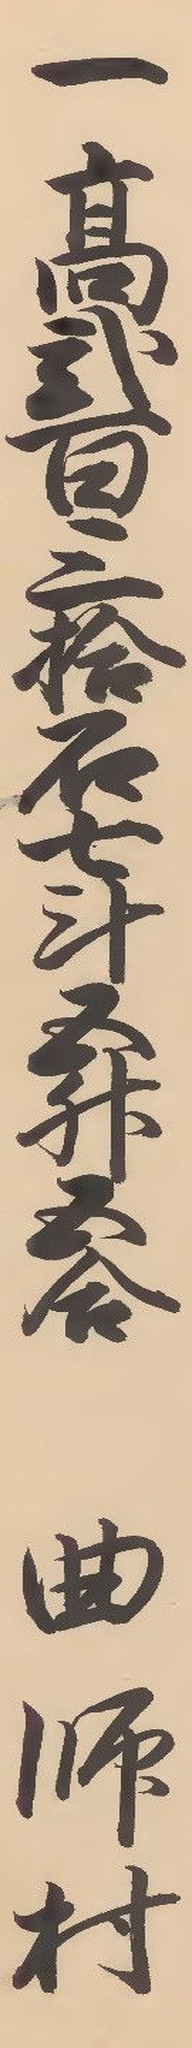一高弐百三拾石七斗五升五合曲師村

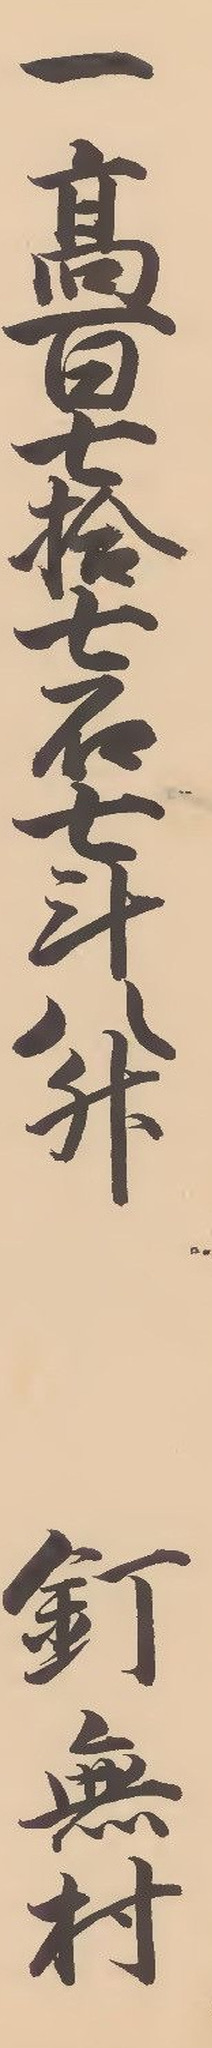一高百七拾七石七斗八升釘無村
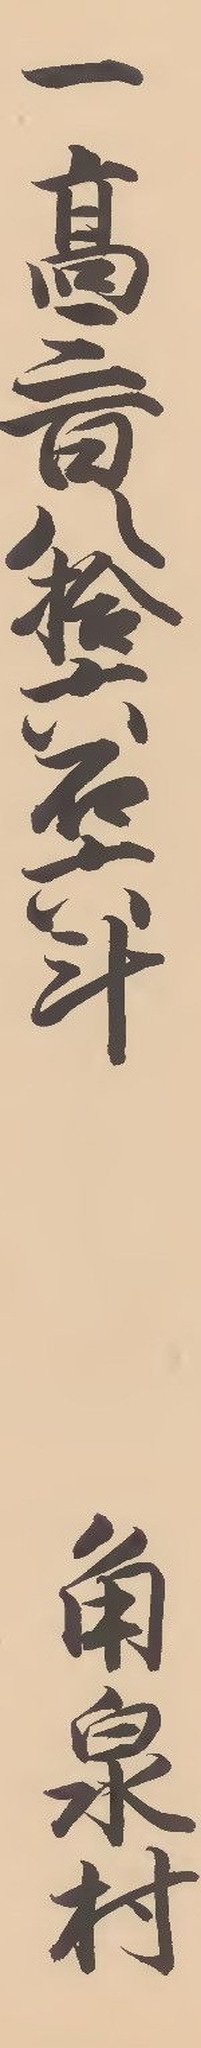一高三百八拾六石六斗角泉村
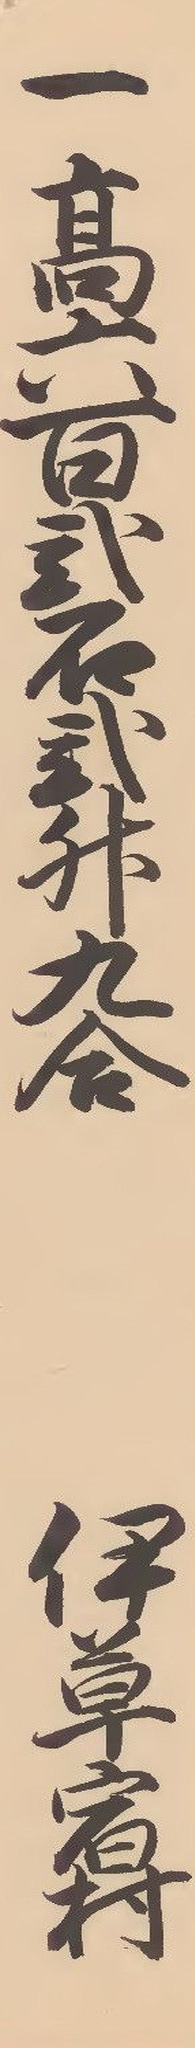一高六百弐石弐升九合伊草宿村
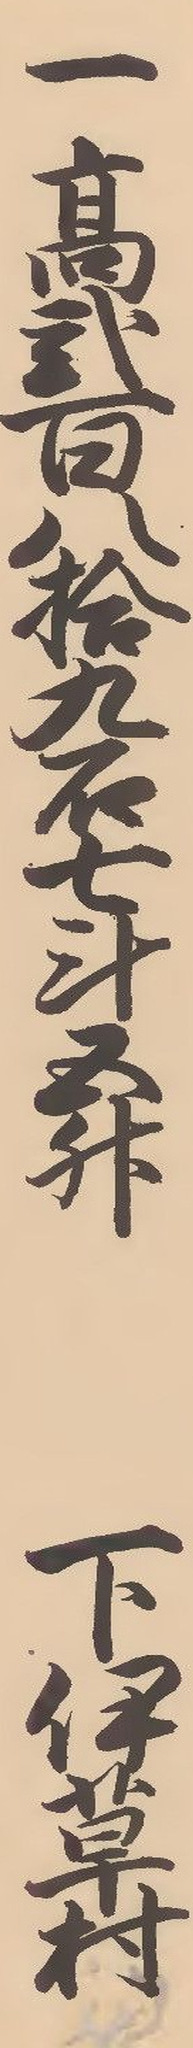一高弐百八拾九石七斗五升下伊草村
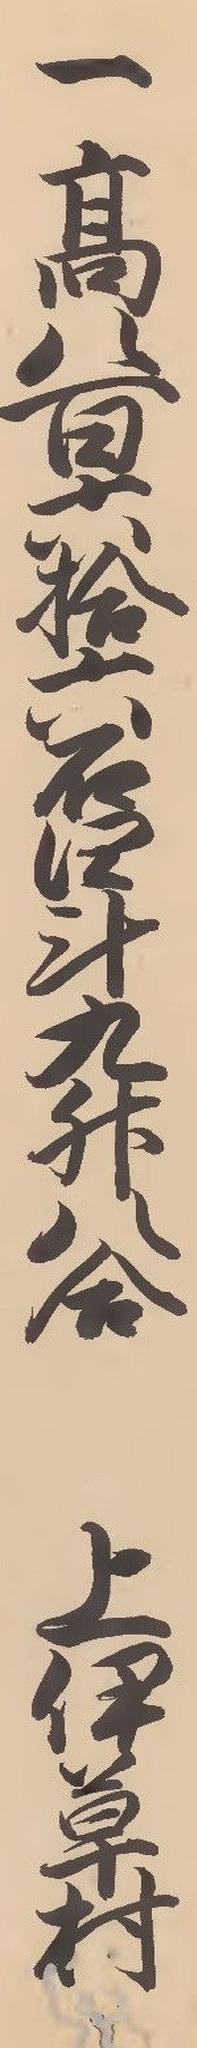一高八百六拾六石四斗九升八合上伊草村
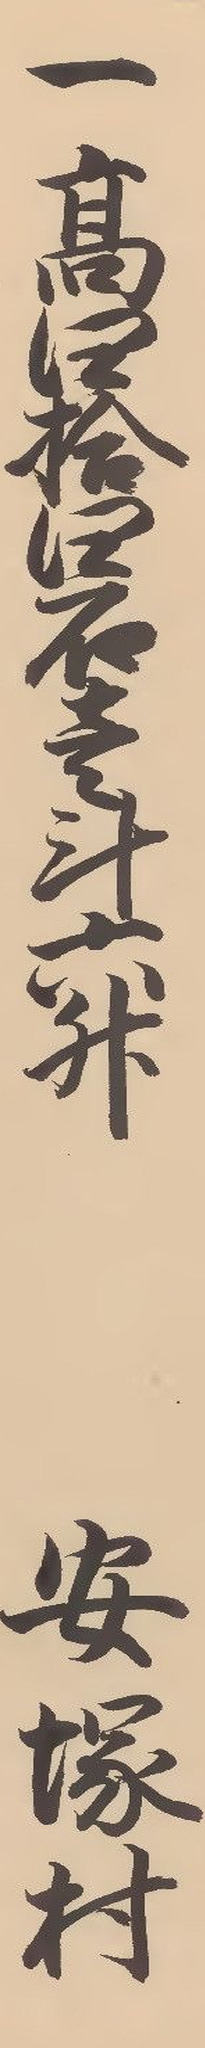一高四拾四石壱斗六升安塚村
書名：武蔵国郷帳　下
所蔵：国立公文書館 National Archives of Japan
